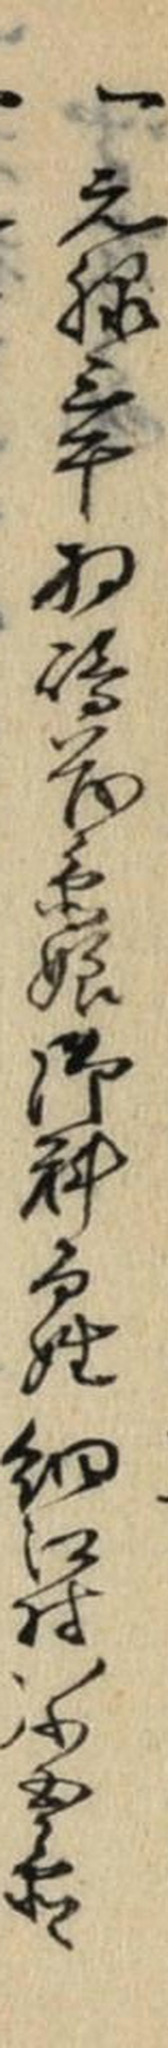一元禄三午拝嶋茂兵娘御料百姓細江村弥五兵衛へ
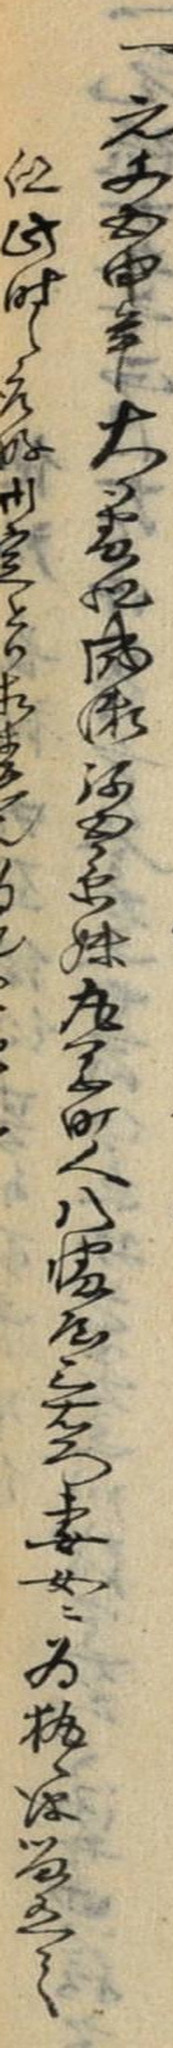一元文五申年大御番組成瀬弥五兵衛妹丸岡町人八幡屋三右衛門妻ニ為執候儀留有之
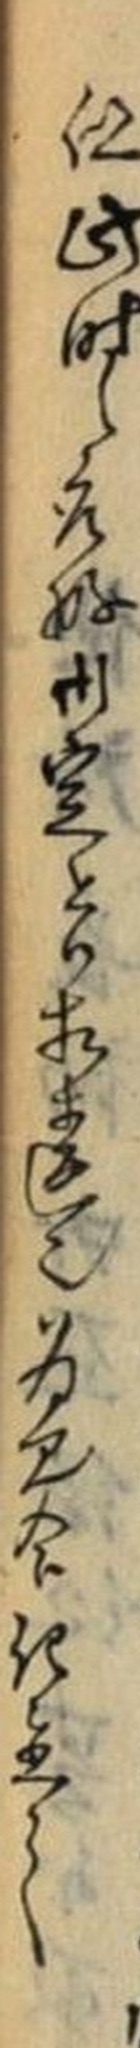但此時之取扱御定とハ相違也為見合被置之
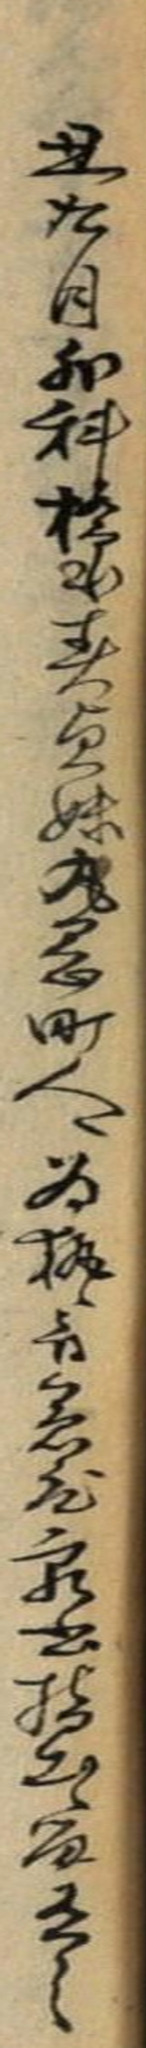一丑九月外科橋本春貞妹丸岡町人ヘ為執候ニ付急度願指出候留有之
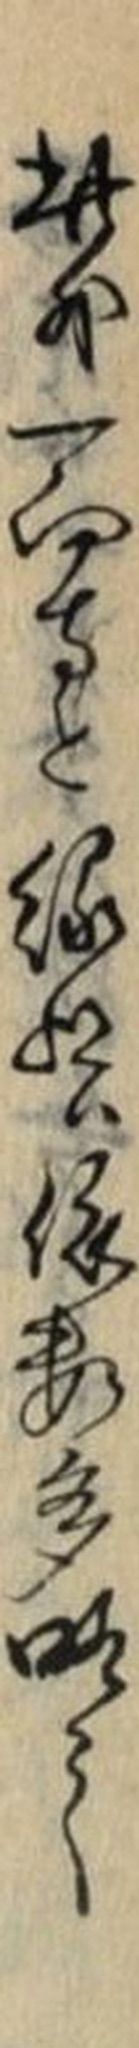此外一向寺と縁組ハ依数多略之
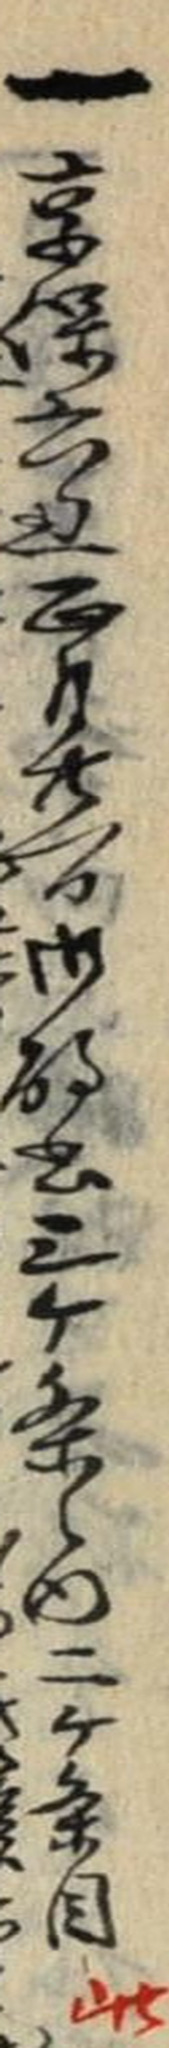一享保六丑正月廿一日御触書三ヶ条之内二ヶ条目
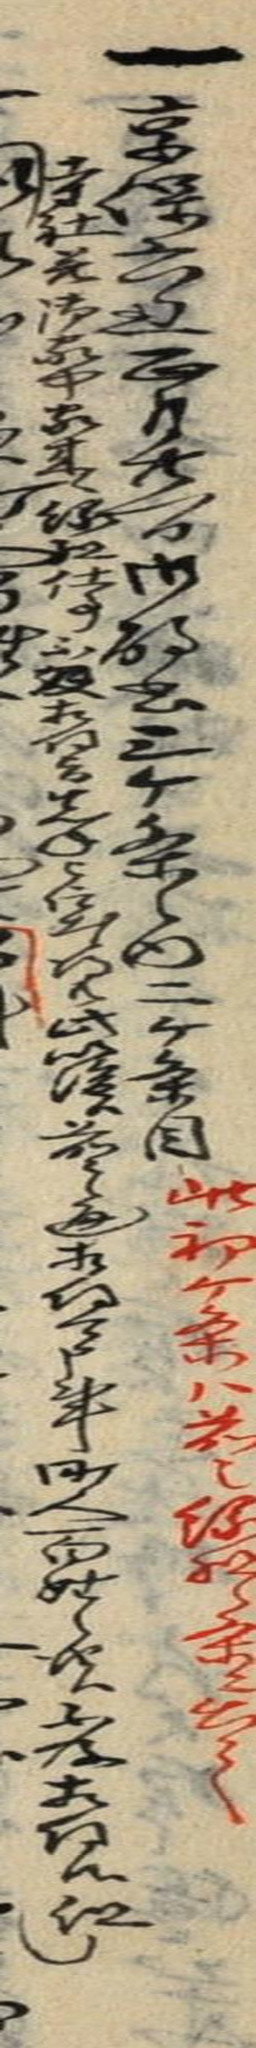一寺社并御家中家来之縁組仕事不及相伺旨先年被仰出候得共此以後ハ前々之通相伺可申事町人百姓之儀ハ不及相伺候但
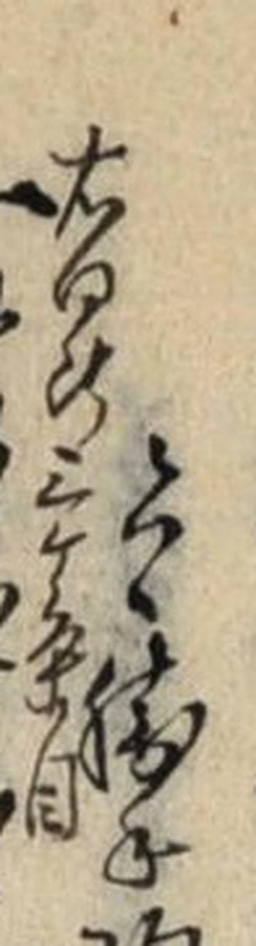右同断三ヶ条目
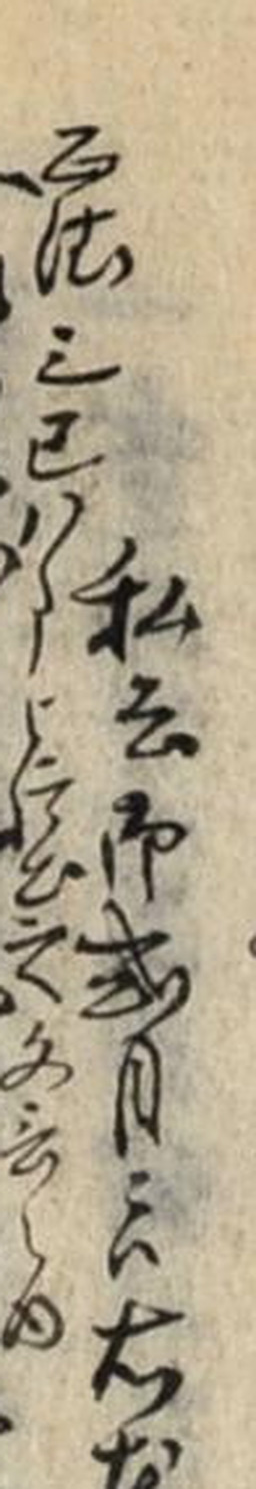正徳三巳八月被仰出之文言之内
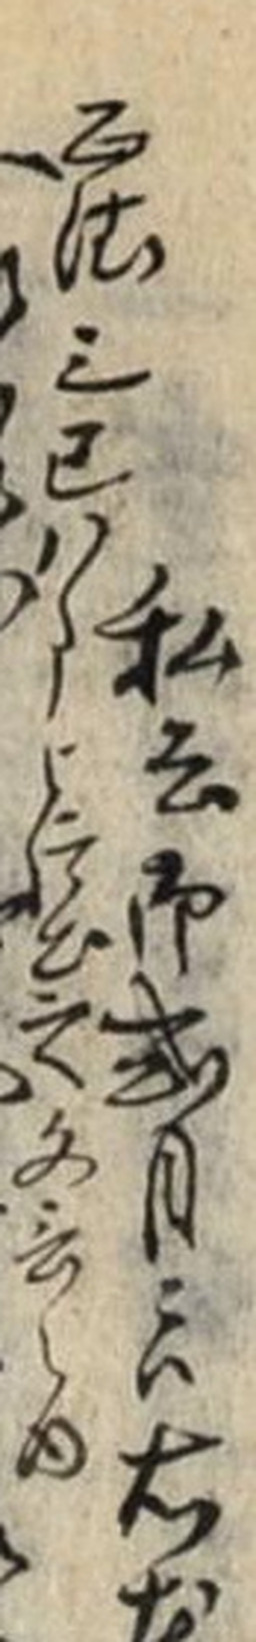正徳三巳八月被仰出之文言之内
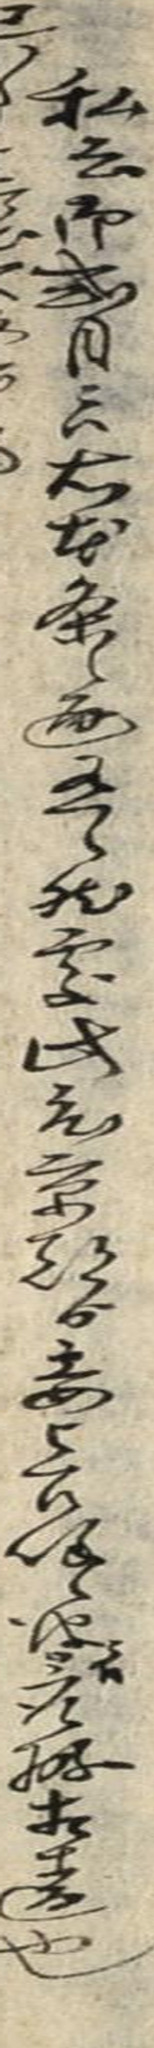私云御式目ニハ右本条之通有之然処此度京都ゟ妾被召呼候儀ニ付取扱相違也
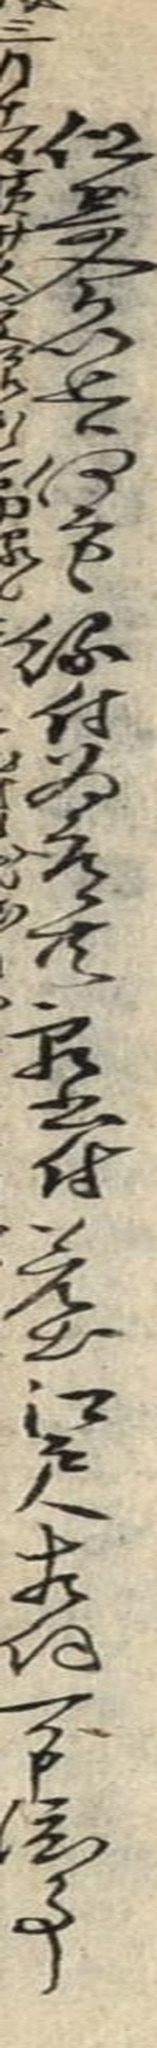但寄合以上ハ何方へ縁付為取候共願書付差出江戸へ相伺可申渡事

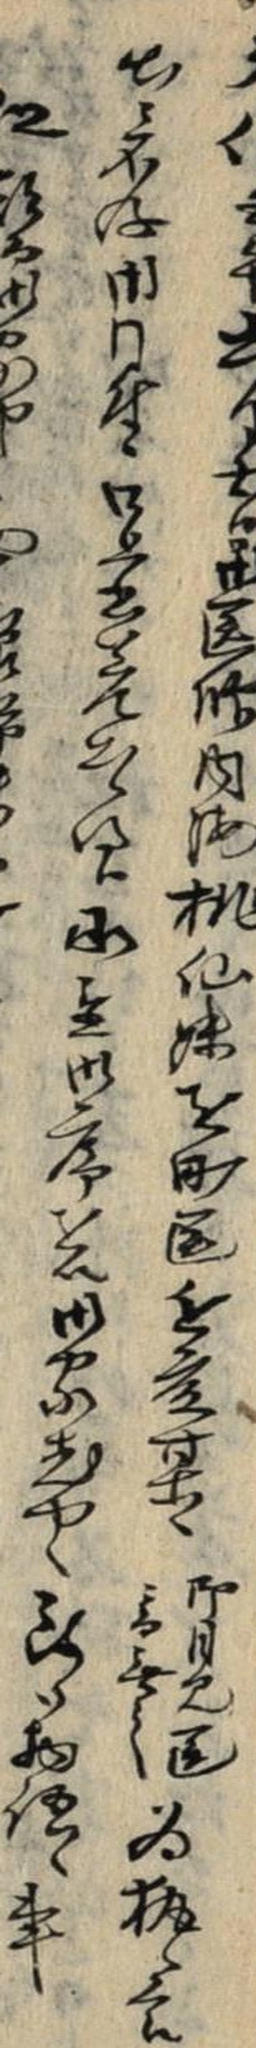出ニ不及御目付へ口上書差出候得ハ承置御序を以御家老中ヘ致御物語候事
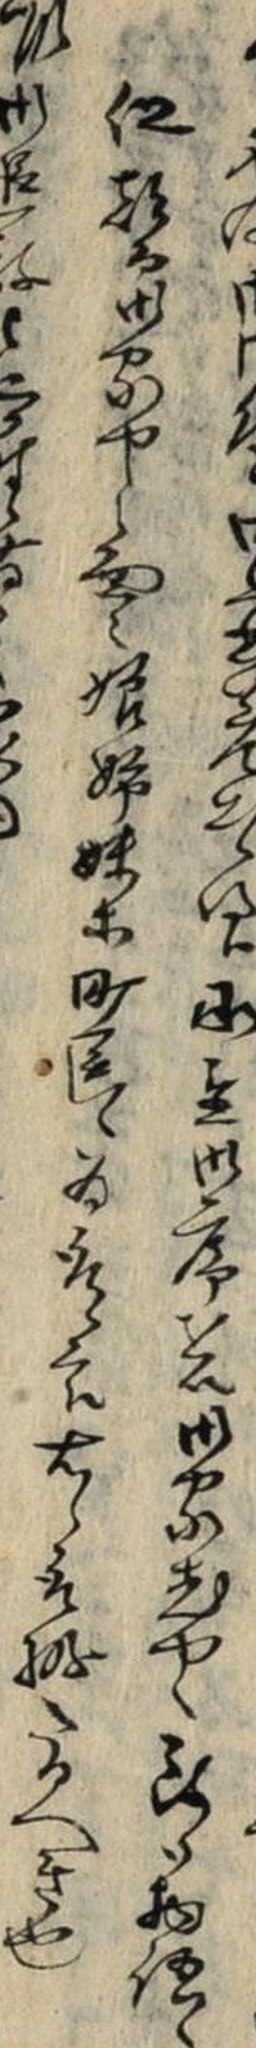但都而御家中之面々娘姉妹等町医へ為取候節右之取扱たるへき也
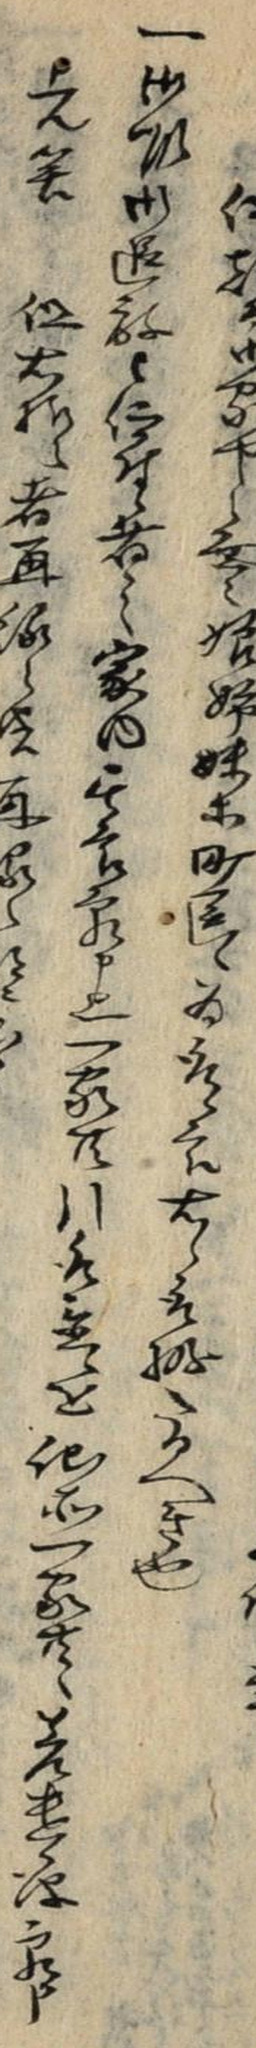一御暇御追放被仰付候者之家内其節願申上一家共引取置候を他所一家共へ差遣候儀願申
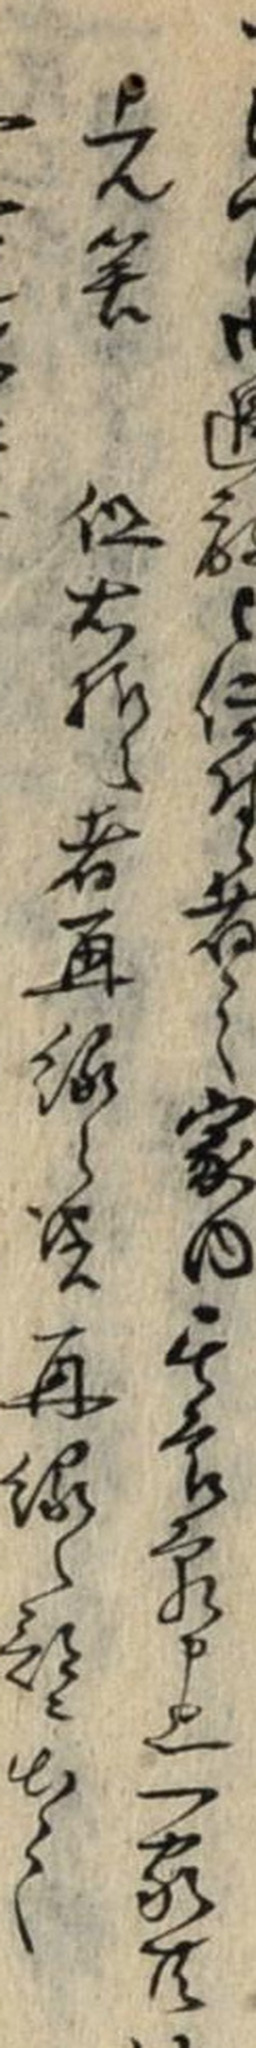上ル筈但右様之者再縁之儀ハ再縁之部ニ出之
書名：養子縁組之部
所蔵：福井県文書館 Fukui Prefectural Archives
